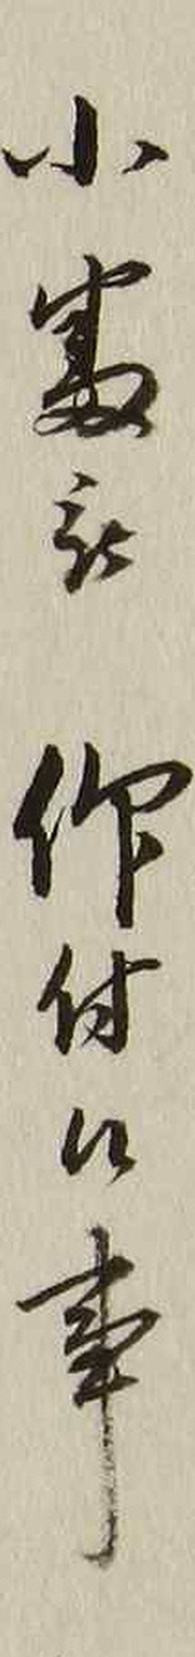小番被仰付候事
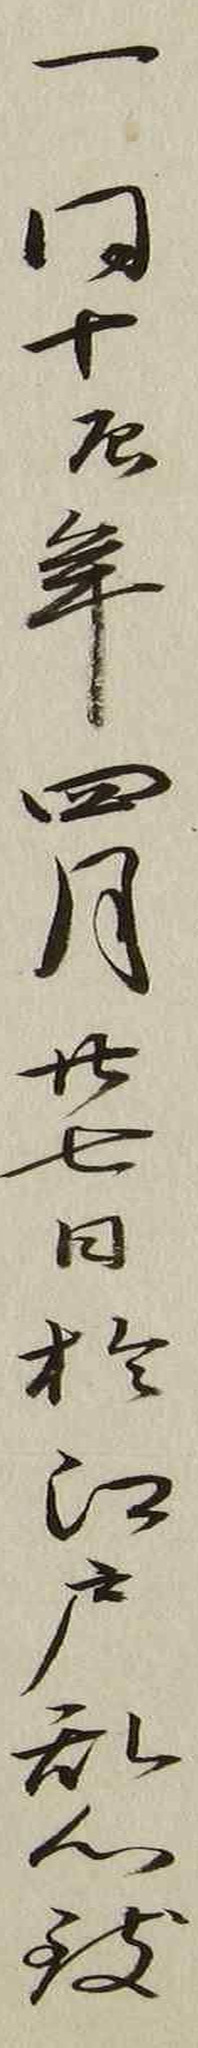一同十辰年四月廿七日於江戸乱心致
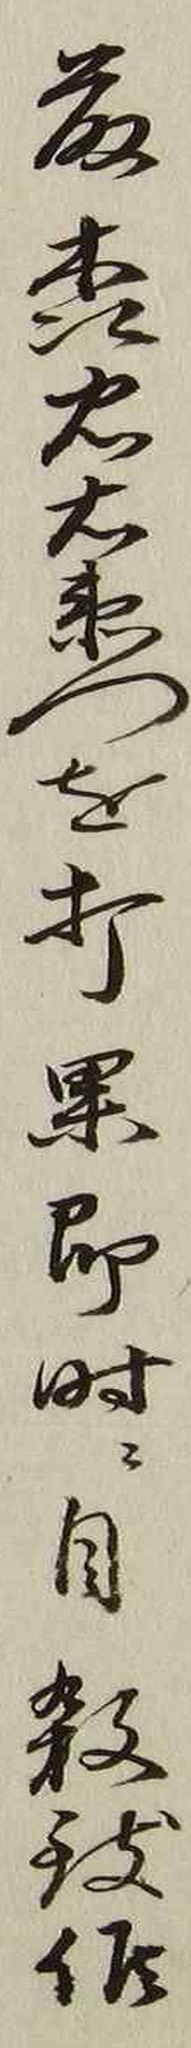藤森忠右衛門を打果即時ニ自殺致候
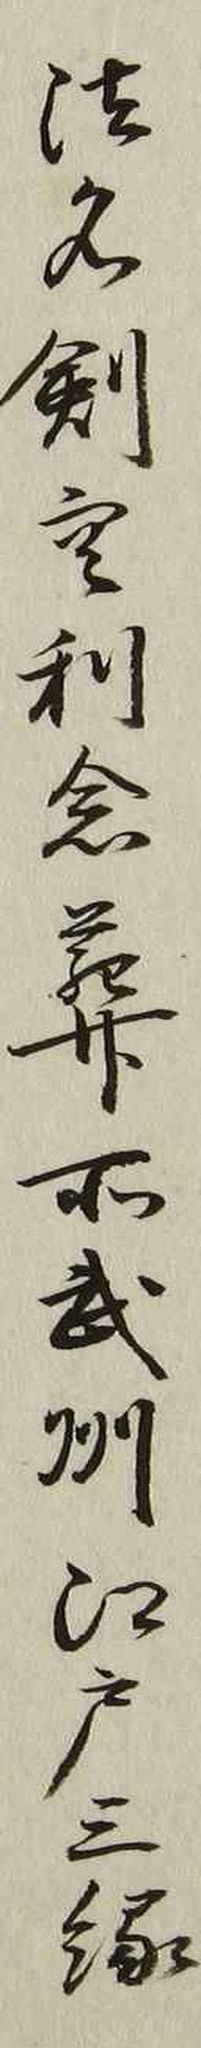法名剣空利念葬所武州江戸三縁
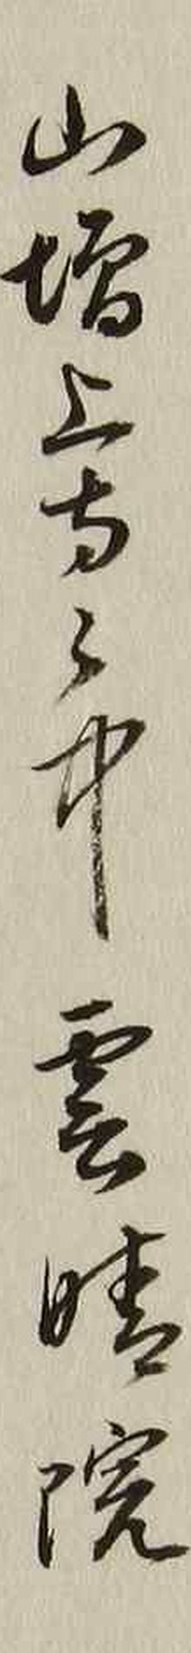山増上寺之中雲晴院
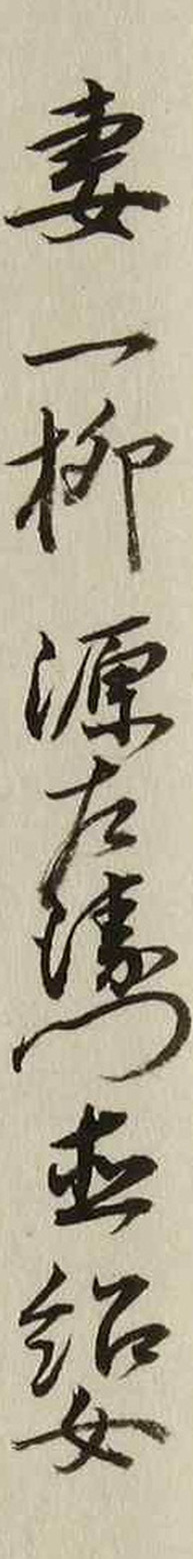妻一柳源左衛門直紹女
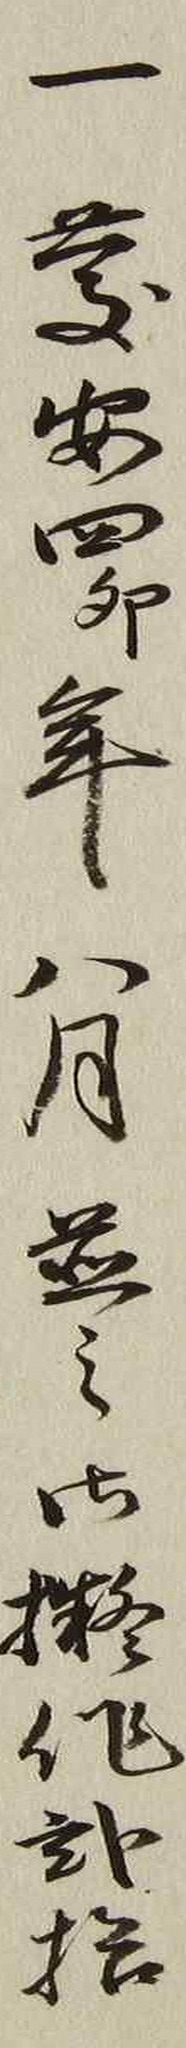一慶安四卯年八月並之御擬作弐拾
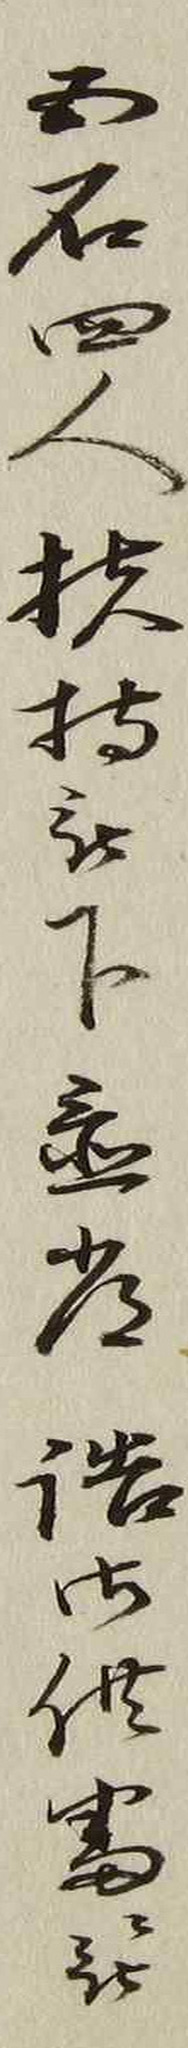五石四人扶持被下置常詰御供番ニ被
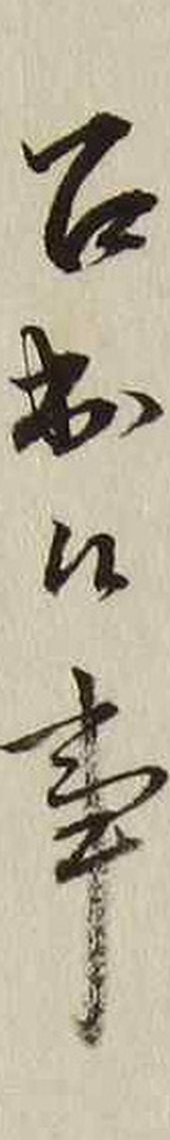召出候事
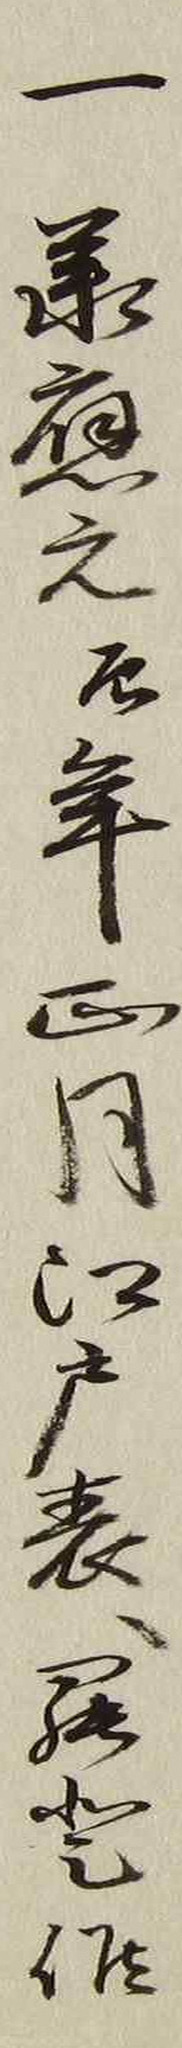一承応元辰年正月江戸表へ罷登候
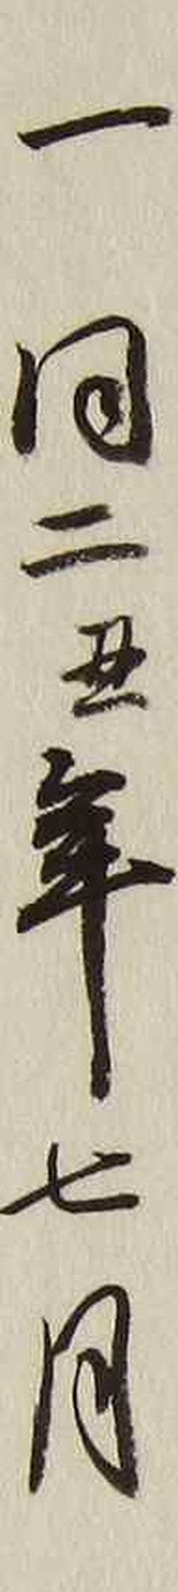一同二丑年七月
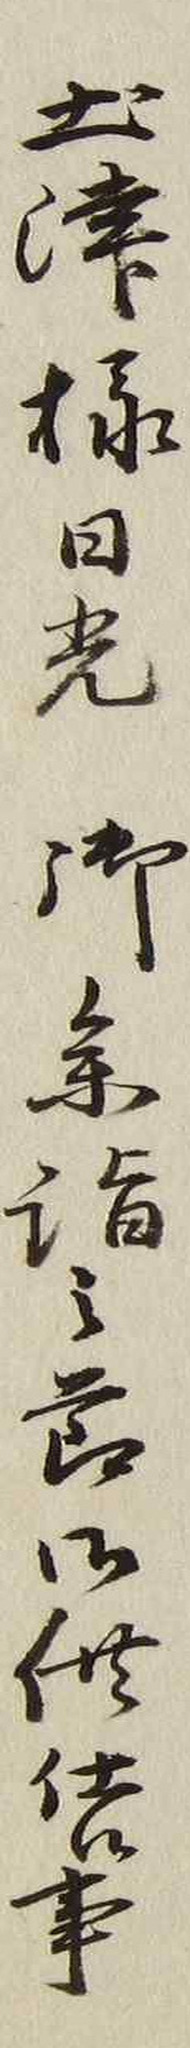土津様日光御参詣之節御供仕候事
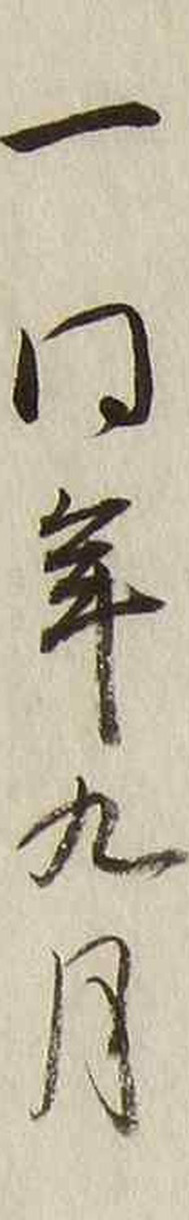一同年九月

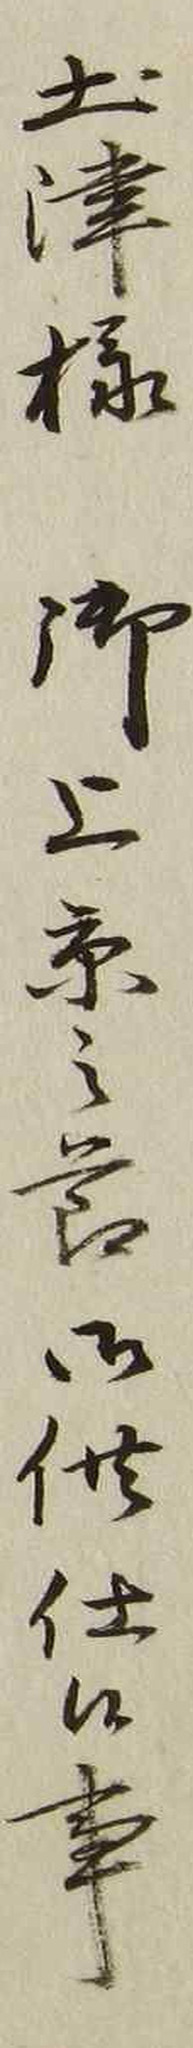土津様御上京之節御供仕候事
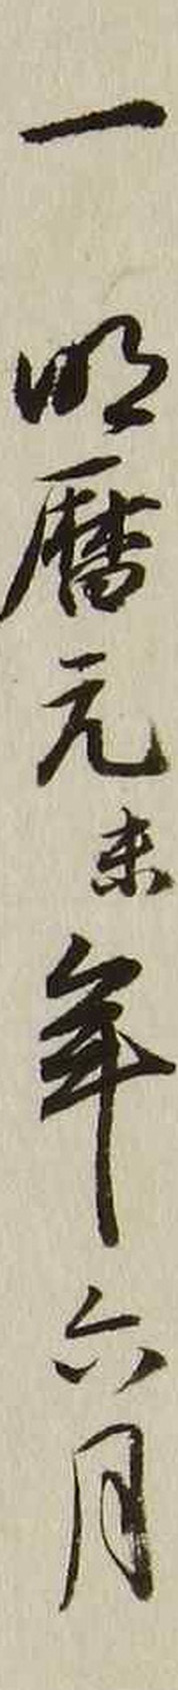一明暦元未年六月
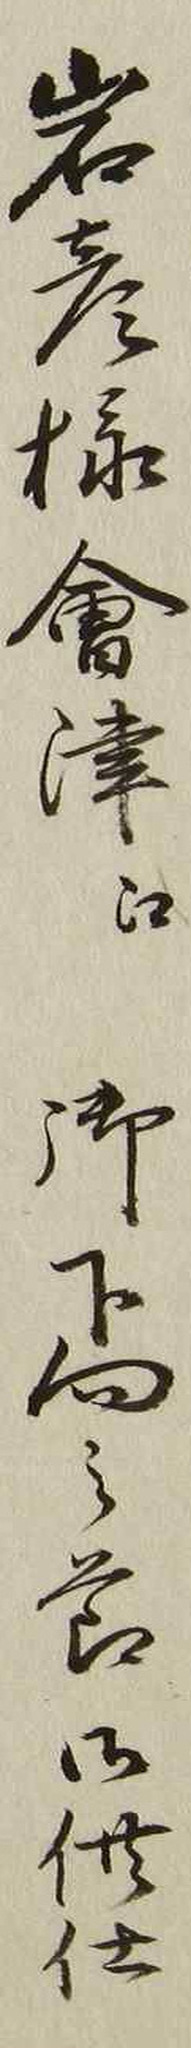岩彦様会津え御下向之節御供仕
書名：諸士系譜　巻之160　な之部2
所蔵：会津若松市立会津図書館
